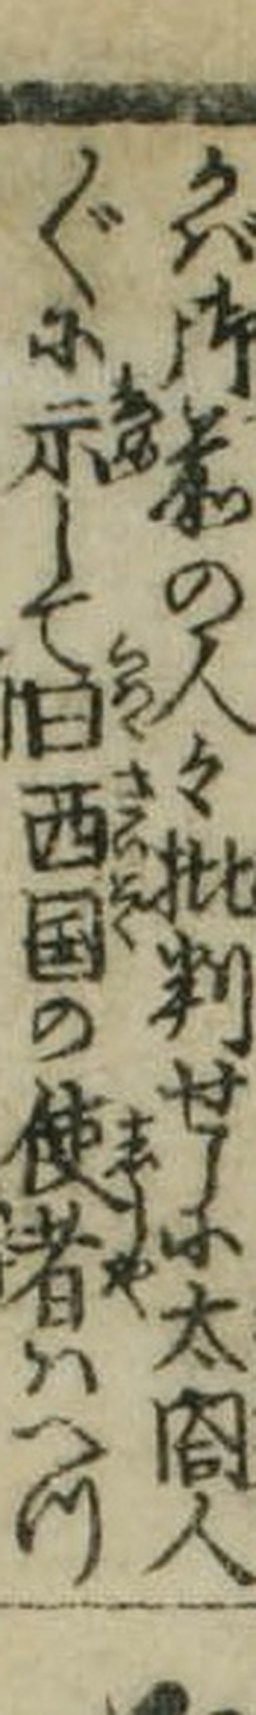〴〵に示して曰西国の使者はへつ
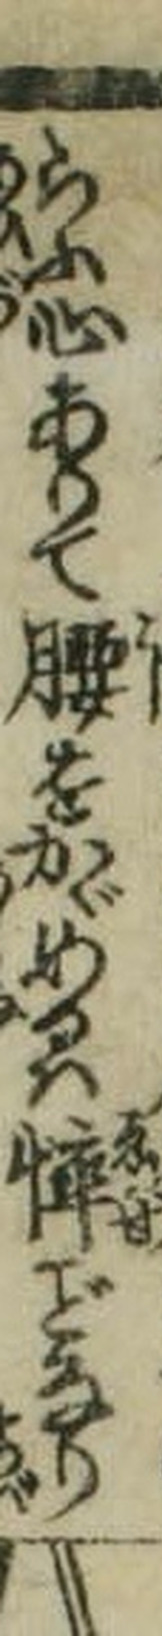らふ心ありて腰をかゞめるは悴ごとなり
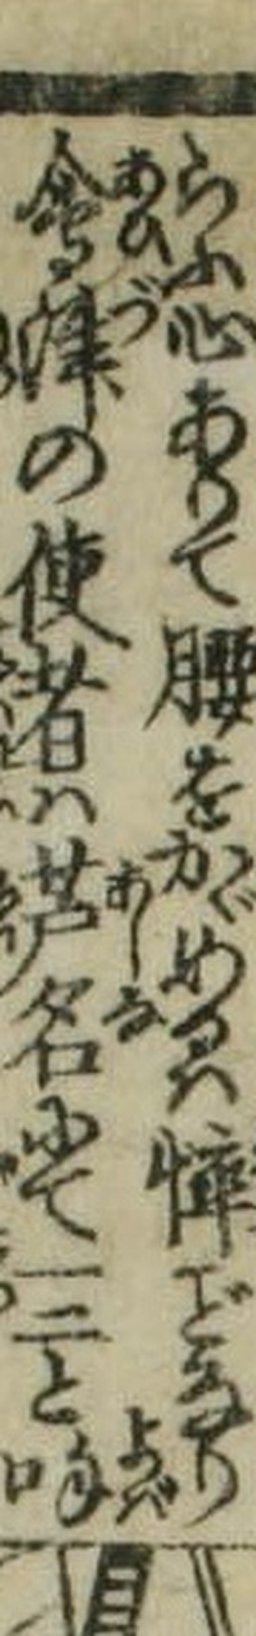会津の使者は芦名にて一二と呼
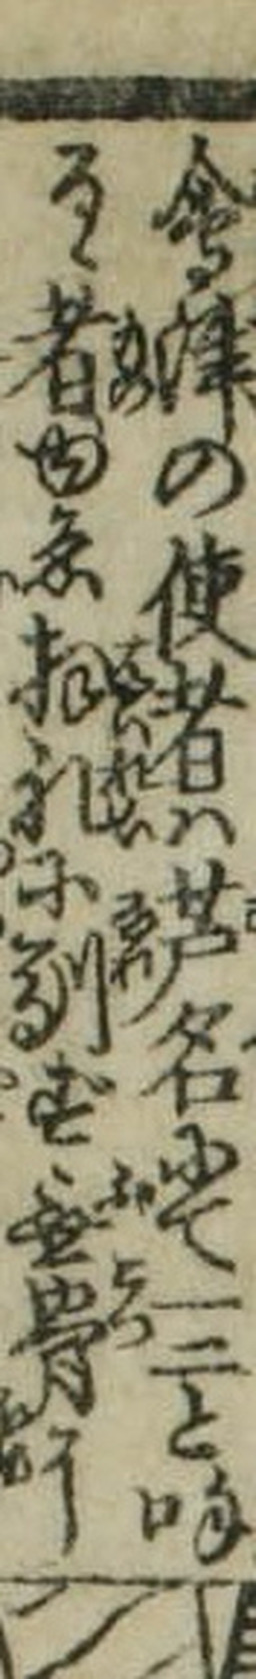るゝ者ゆゑ拝礼に馴ず無骨に
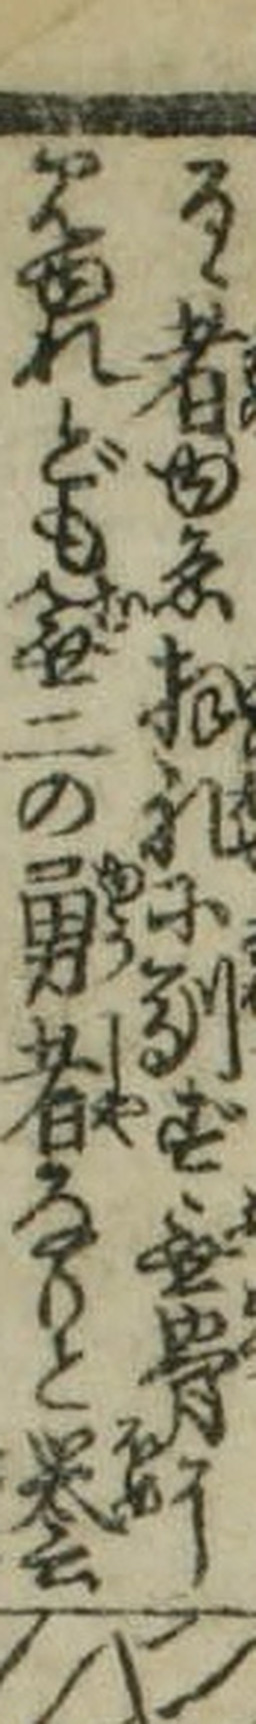見ゆれども無二の勇者なりと誉
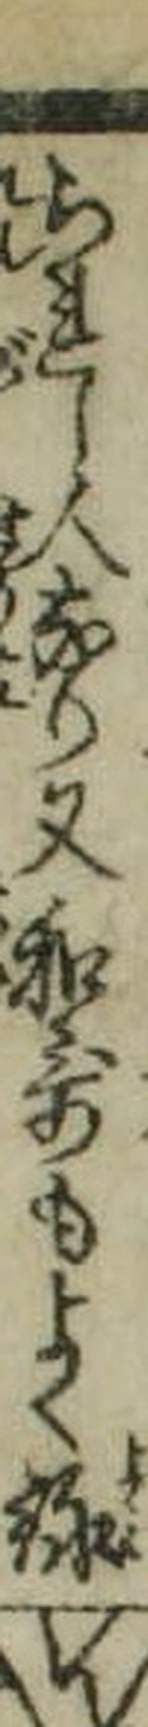られし人なり又和哥もよく詠
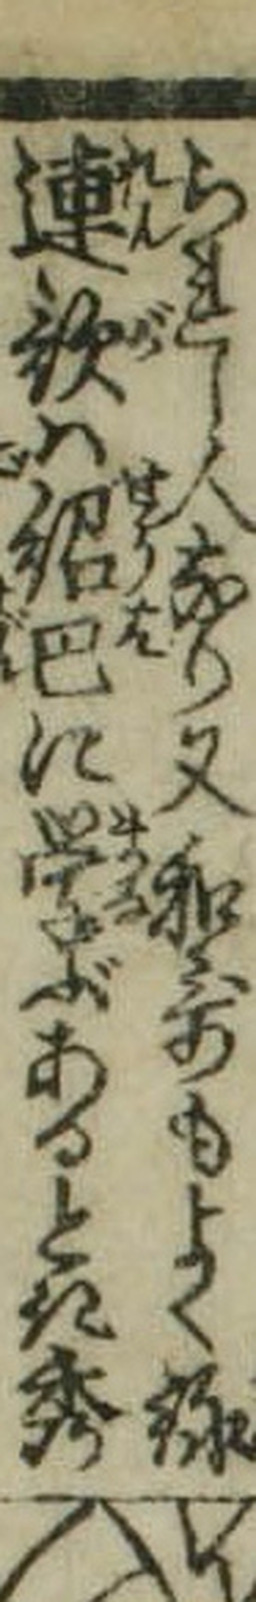連歌は紹巴に学ぶあるとき秀
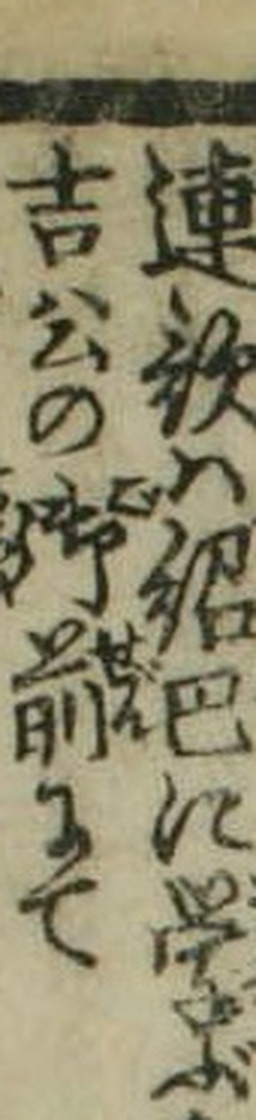吉公の御前にて
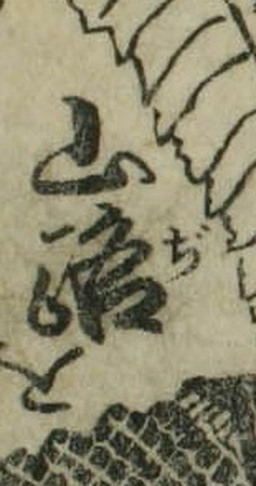山路を
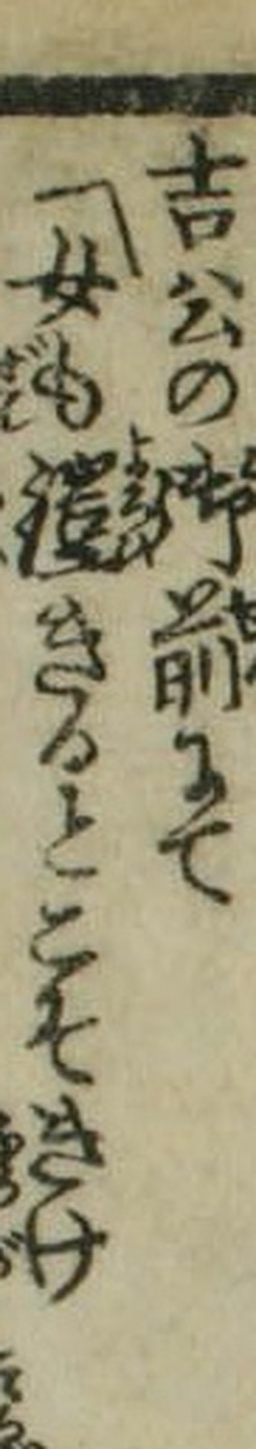〽女も鎧きるとこそきけ
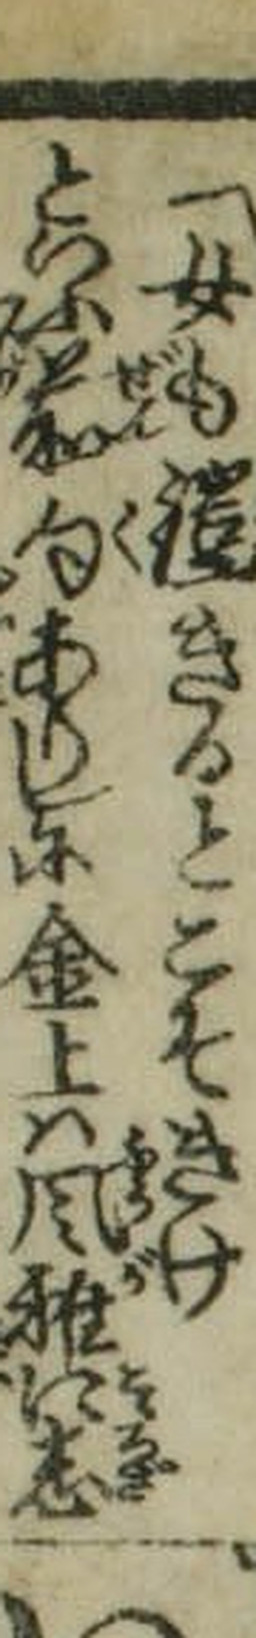といふ前句ありしに金上は風雅に志
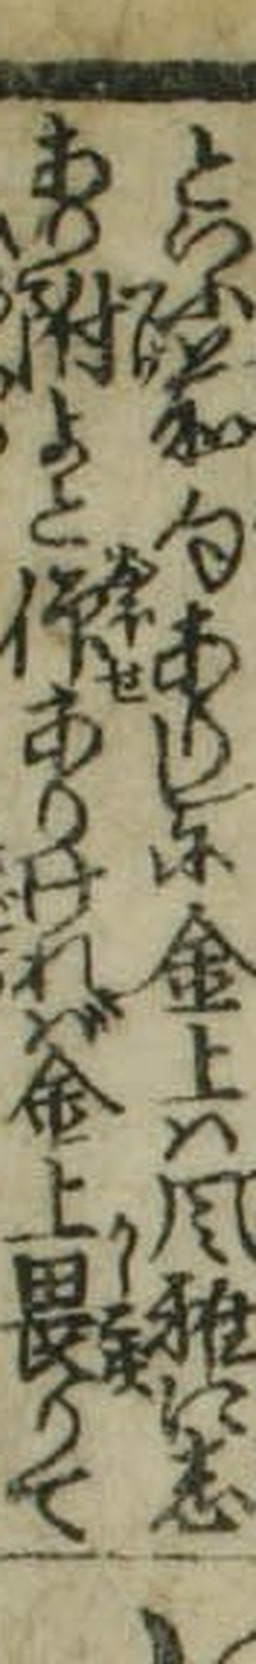あり附よと仰ありければ金上畏りて
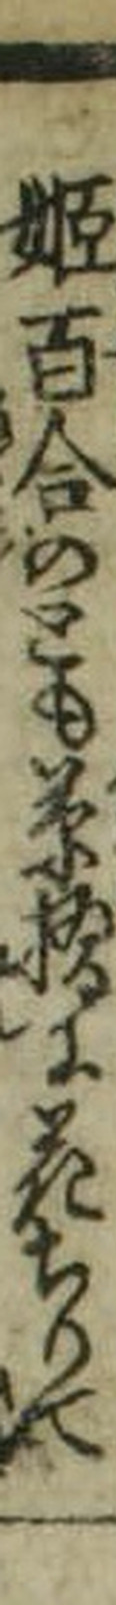姫百合のとも草摺に花ちりて
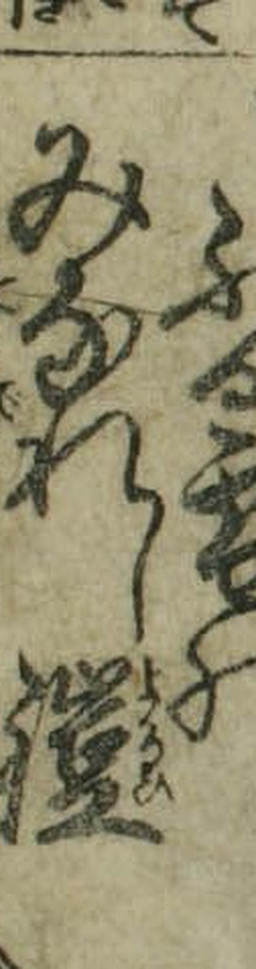みなれし鎧
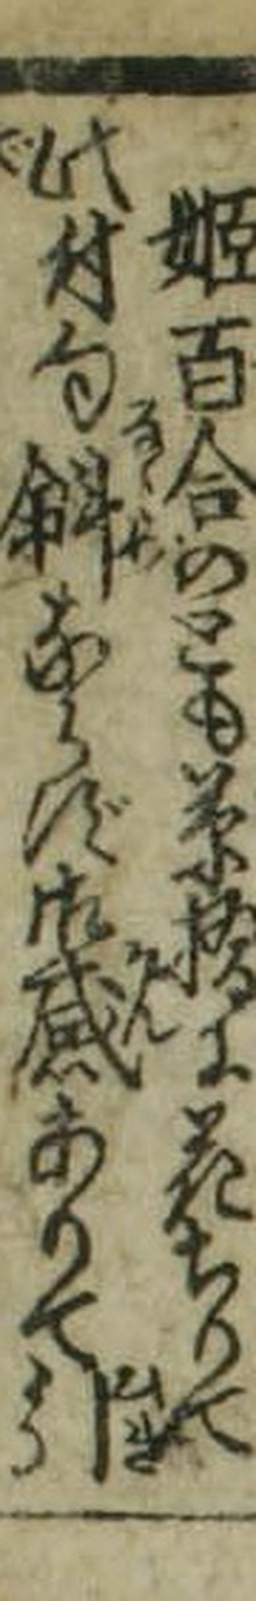此付句斜ならず御感ありて引
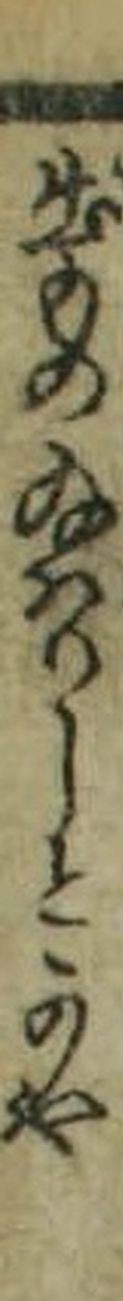出もの給はりしとかや
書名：續英雄百人一首
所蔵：東京学芸大学附属図書館
